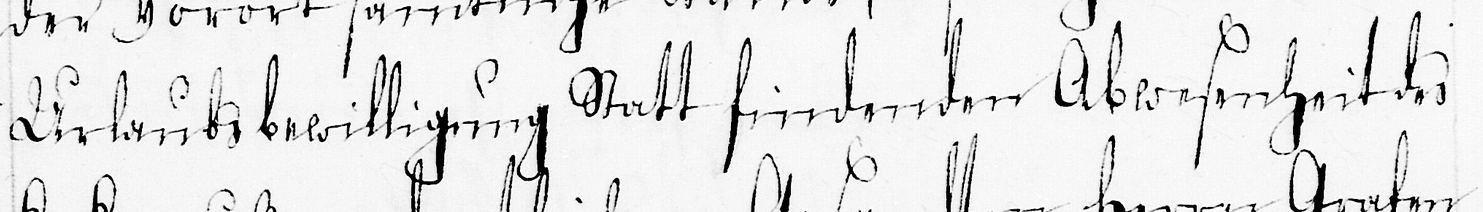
Urlaubsbewilligung Statt findenden Abwesenheit des
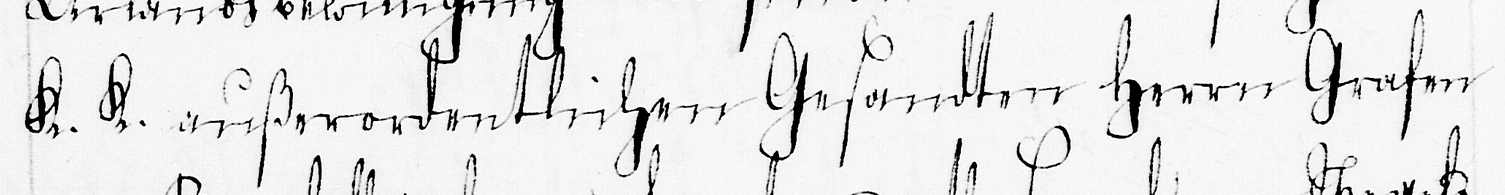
K. K. außerordentlichen Gesandten Herrn Grafen
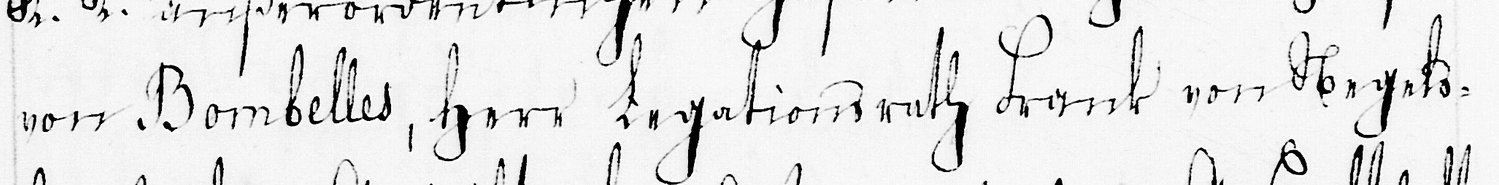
von Bombelles, Herr Legationsrath Frank von Negels¬
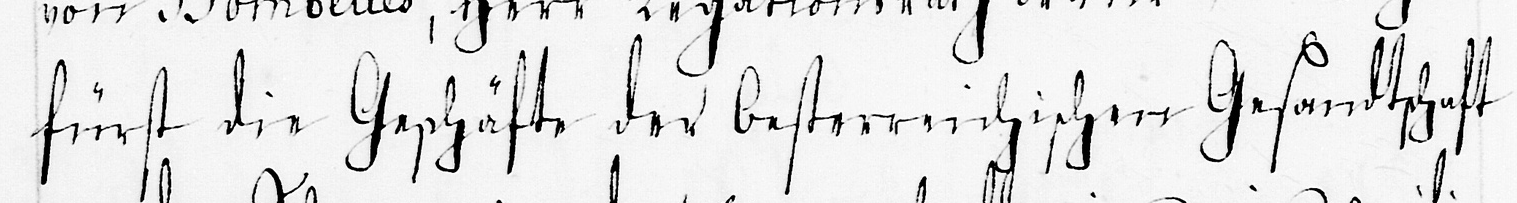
fürst die Geschäfte der Oesterreichischen Gesandtschaft
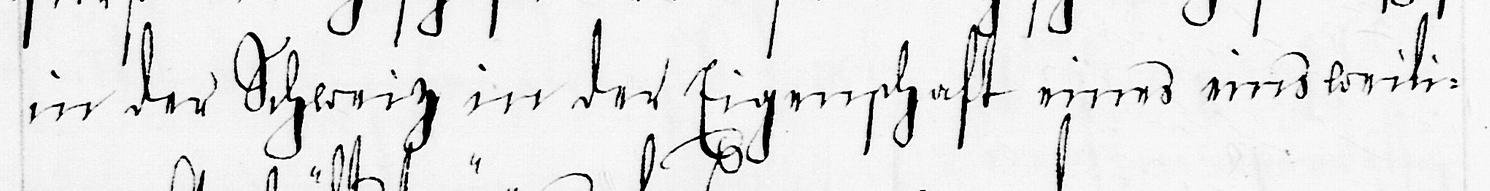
in der Schweiz in der Eigenschaft eines einsweili¬
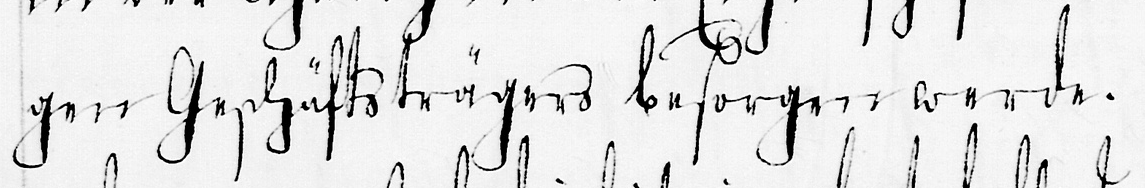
gen Geschäftsträgers besorgen werde.
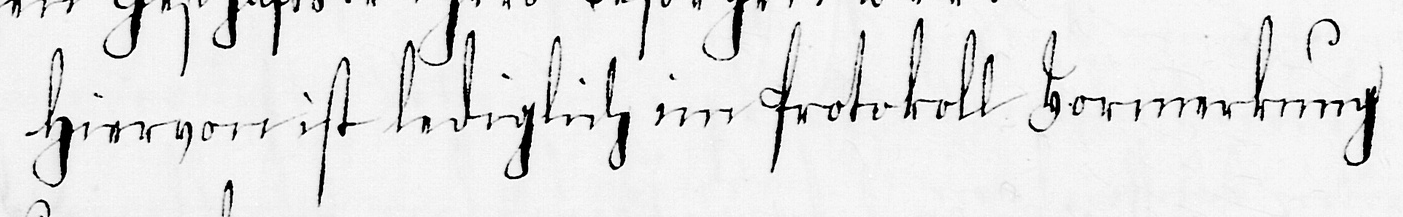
Hiervon ist lediglich im Protokoll Vormerkung
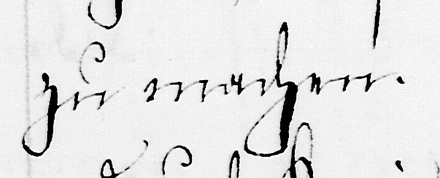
zu machen.
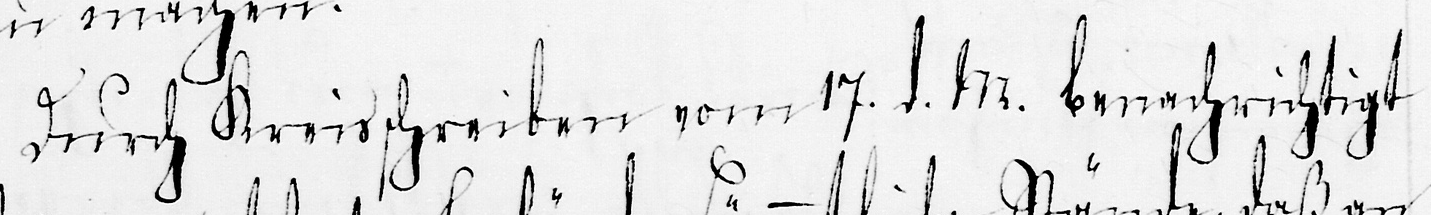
Durch Kreisschreiben vom 17. d. M. benachrichtigt
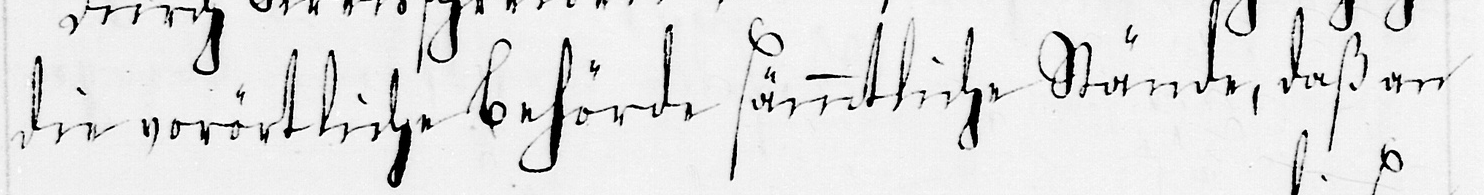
die vorörtliche Behörde sämmtliche Stände, daß an
